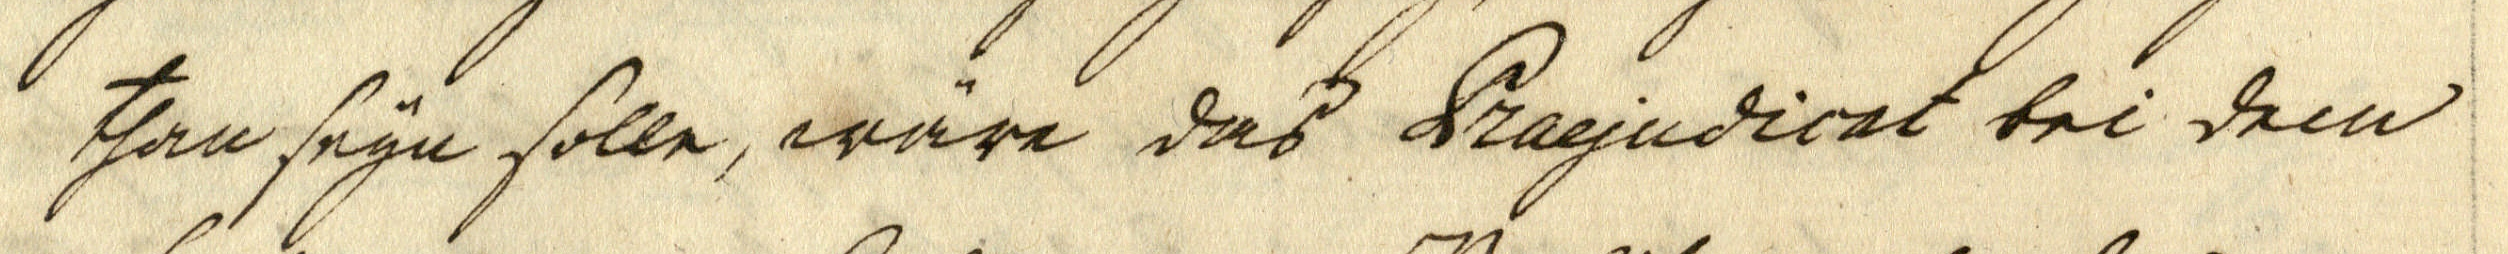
than seyn solle, wäre das Praejudicat bei dem
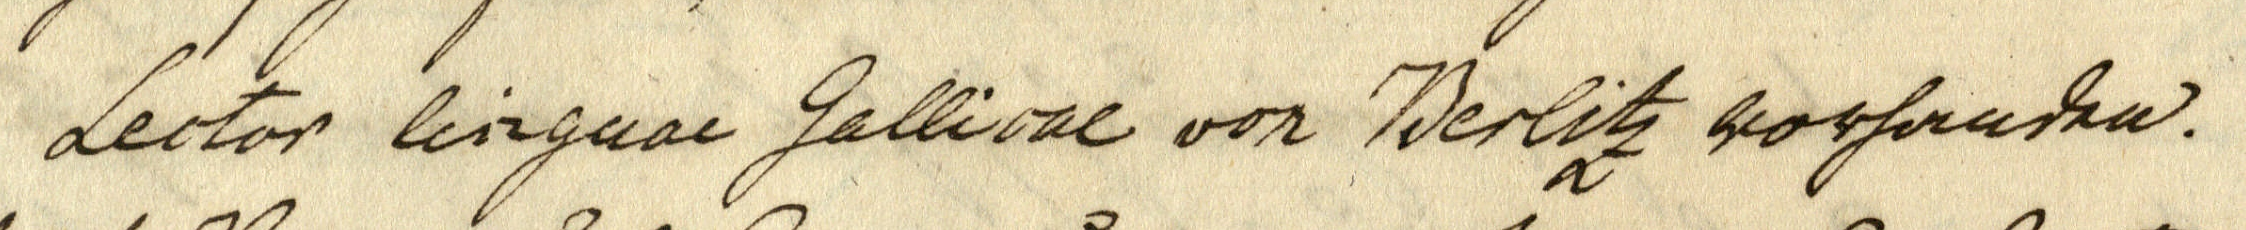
Lector linguae Gallicae von Berlitz vorhanden.
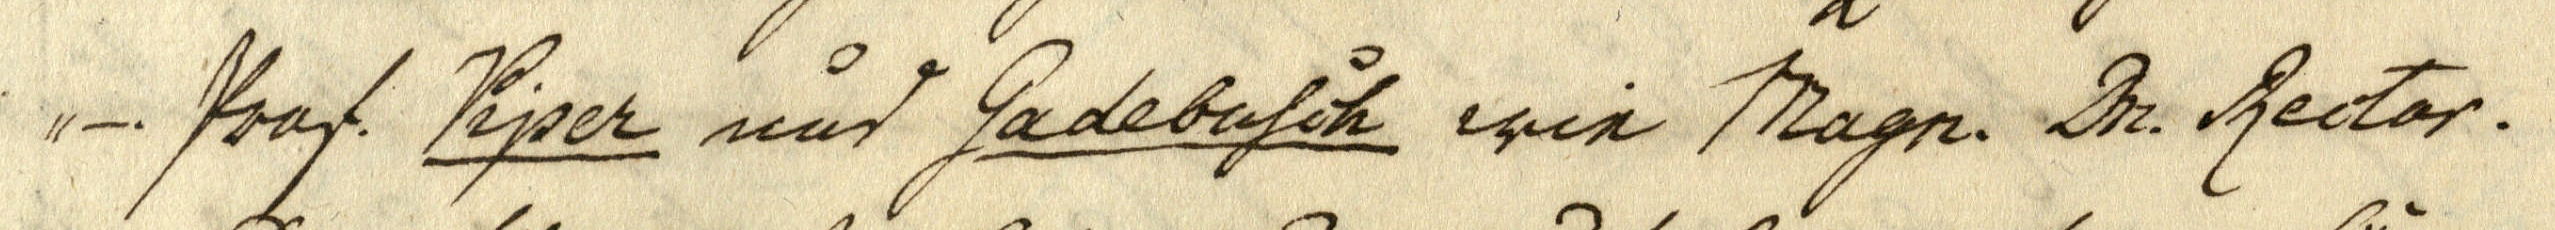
" - . Prof. Piper und Gadebusch wie Magn. Dn. Rector.
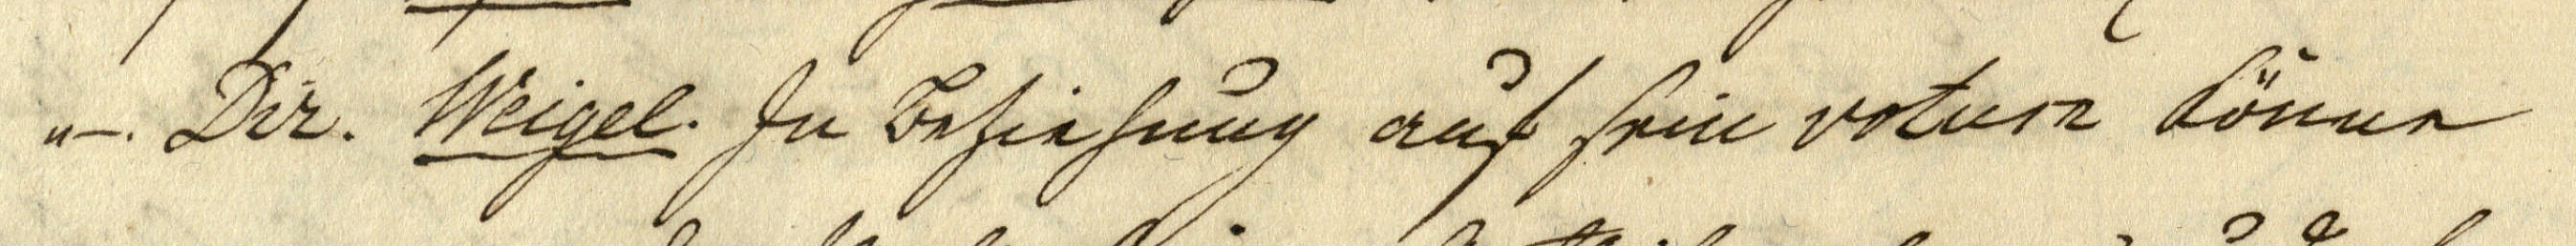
" - . Dir. Weigel. In Beziehung auf sein votum könne
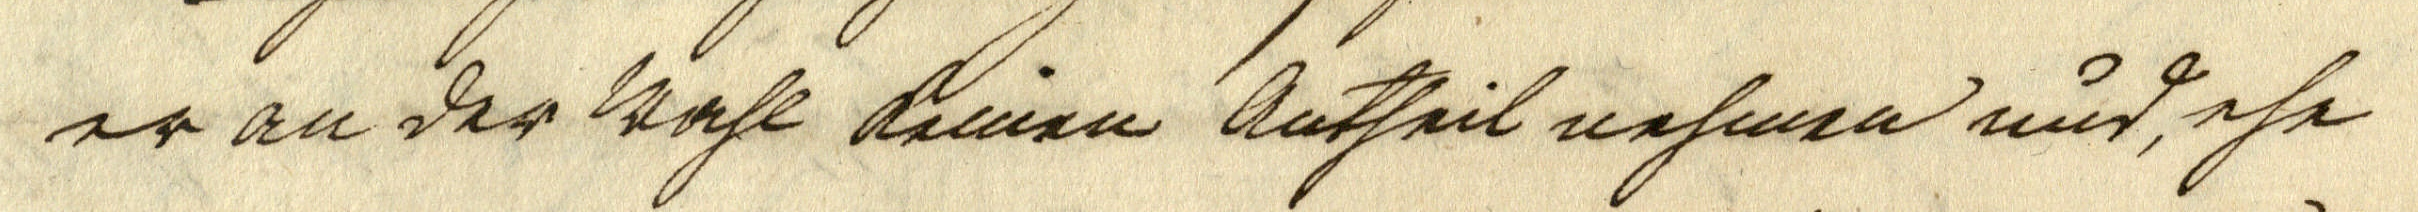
er an der Wahl keinen Antheil nehmen und , ehe
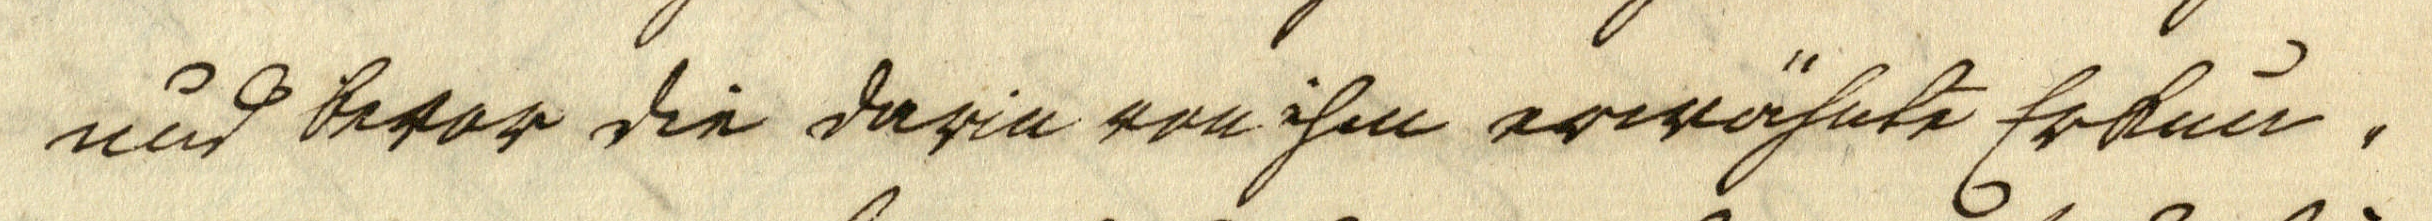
und bevor die darin von ihm erwähnte Erkun-
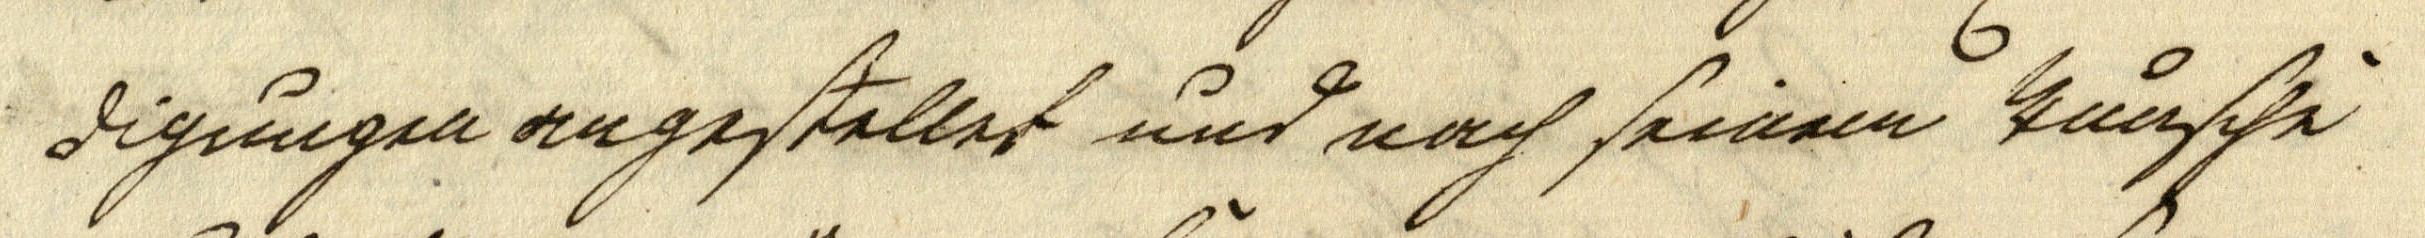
digungen angestellet und nach seinem Wunsche
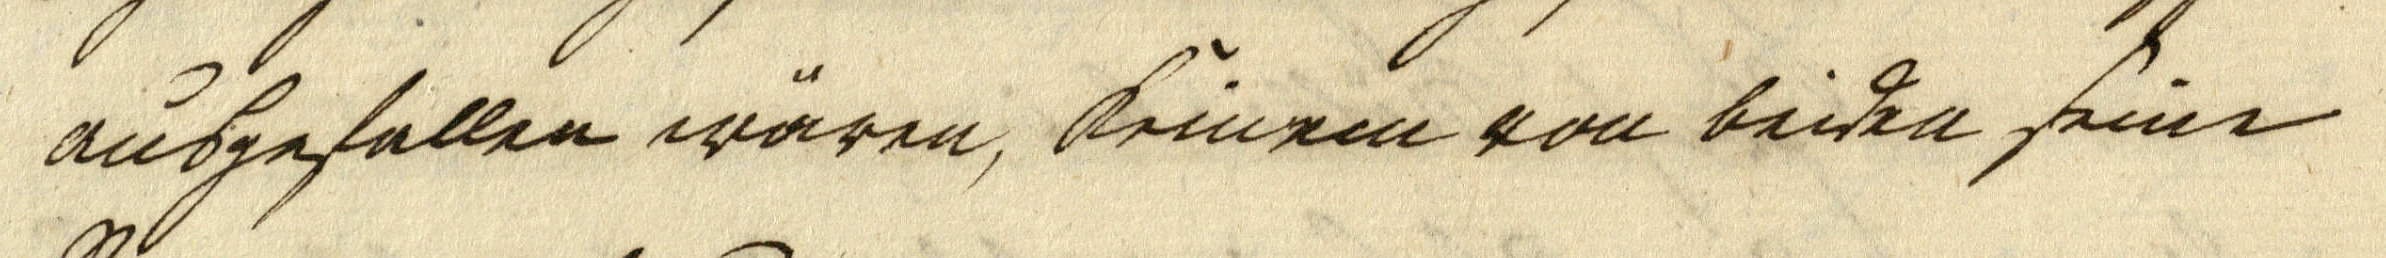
ausgefallen wären, keinem von beiden seine
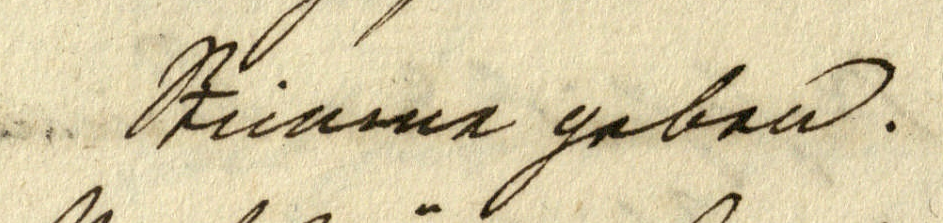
Stimme geben.
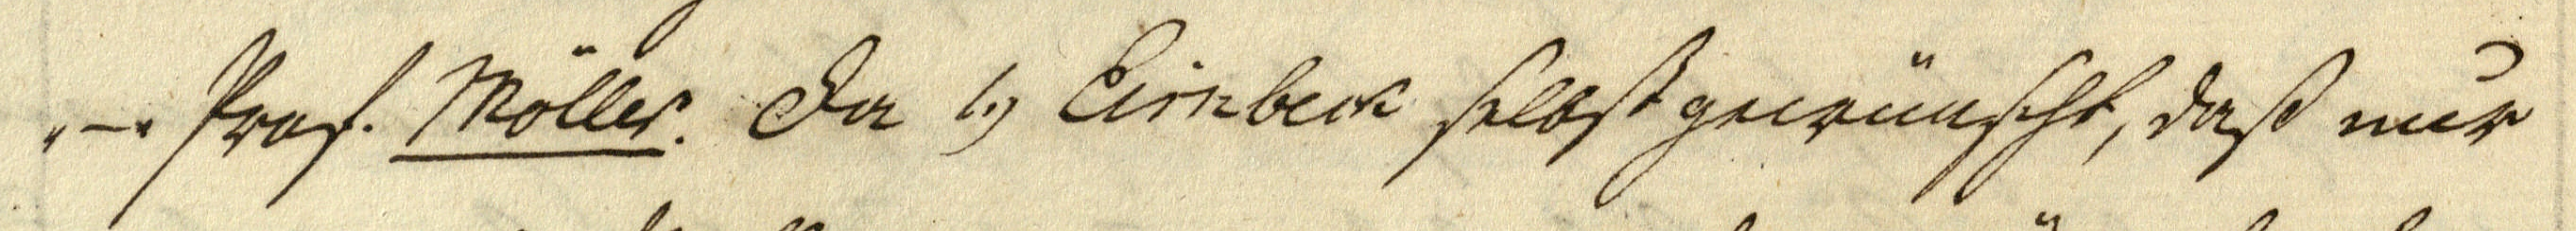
" - " Prof. Möller. Da 1.) Eimbeck selbst gewünschet, daß nur
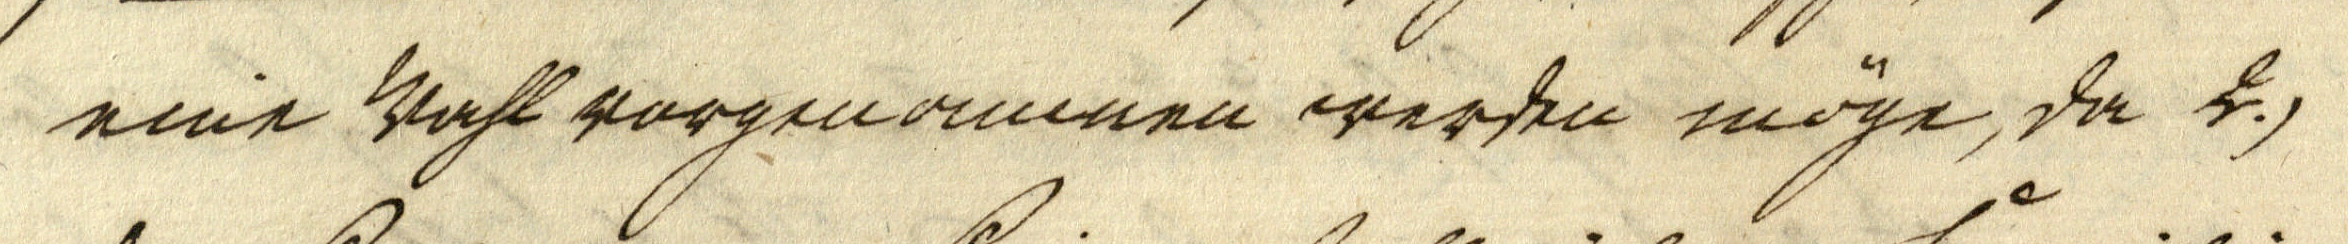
eine Wahl vorgenommen werden möge, da 2.)
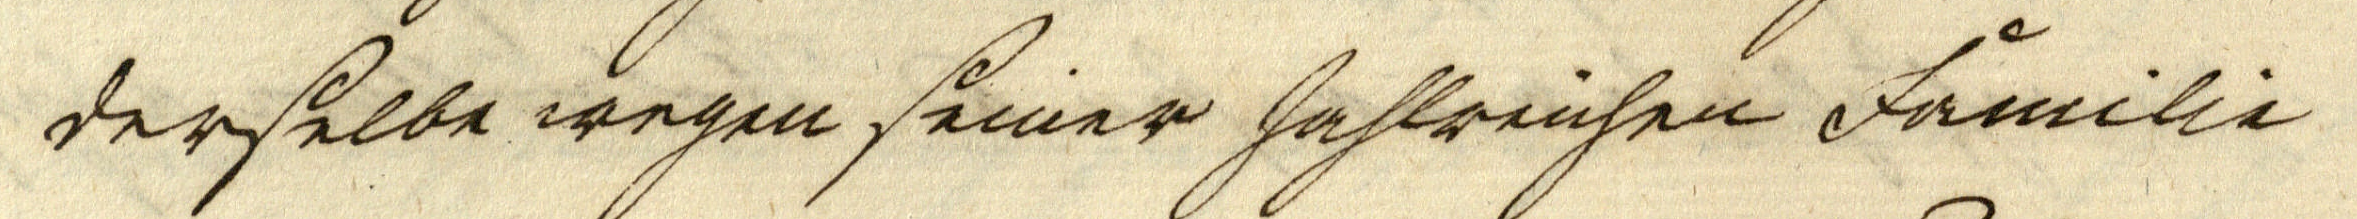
derselbe wegen seiner zahlreichen Familie
